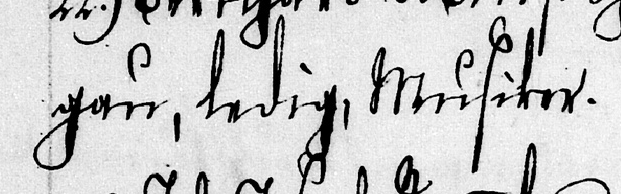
gau, ledig, Musiker.
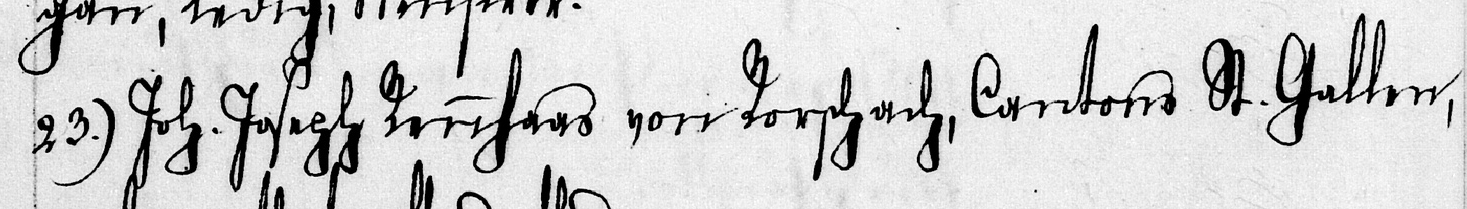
23.) Joh. Joseph Reuhaas von Rorschach, Cantons St. Gallen,
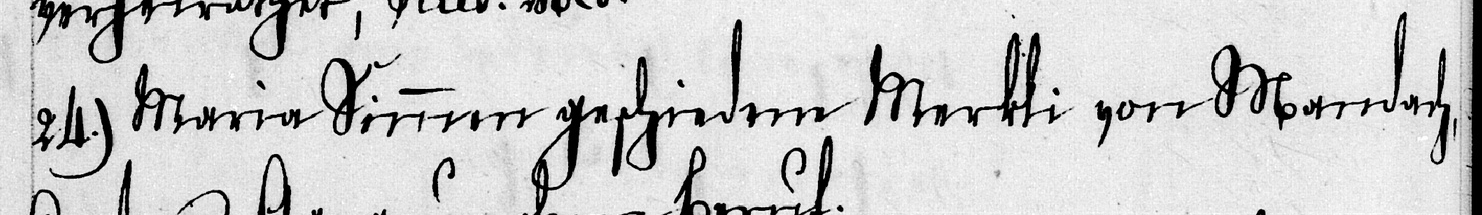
24.) Maria Simmen geschiedene Merkli von Mandach,
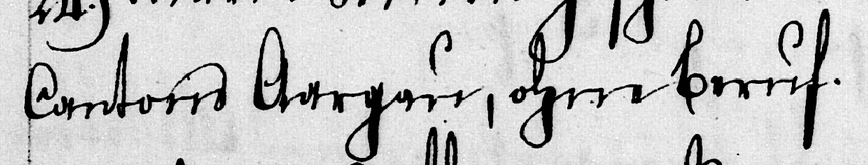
Cantons Aargau, ohne Beruf.
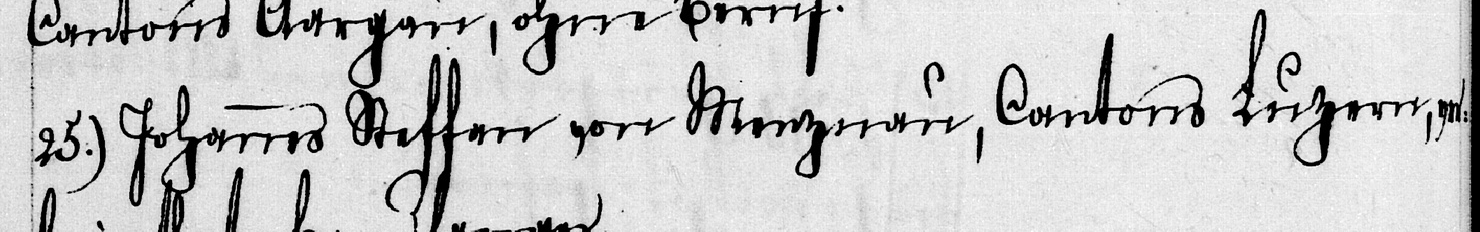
25.) Johannes Steffan von Menznau, Cantons Luzern, ve¬
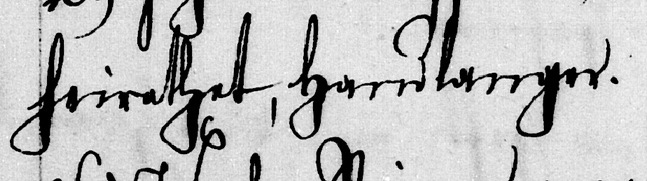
rheirathet, Handlanger.
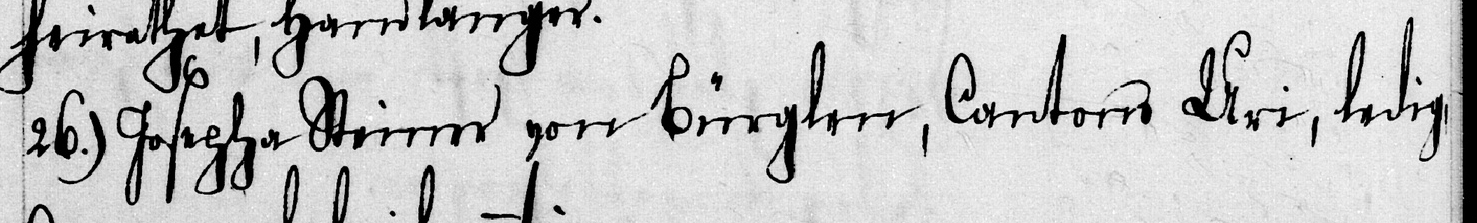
26.) Josepha Steiner von Bürglen, Cantons Uri, ledig,
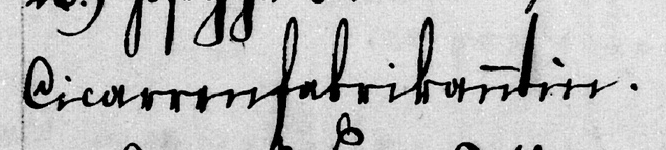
Cicarrenfabrikanntin.
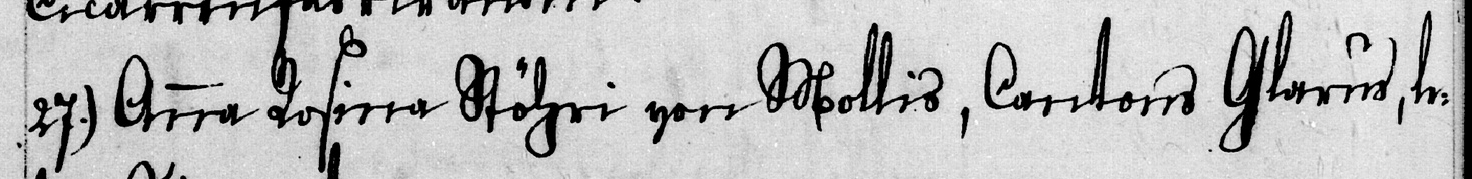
27.) Anna Rosina Stöhri von Molllis, Cantons Glarus, l¬
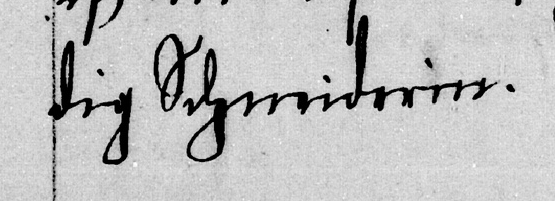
edig Schneiderin.
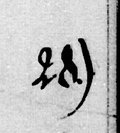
22.)
